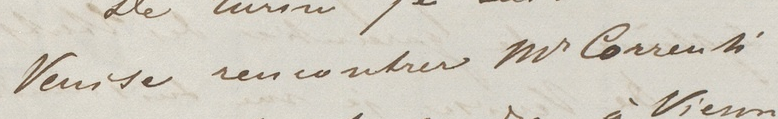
Venise rencontrer MrCorrenti
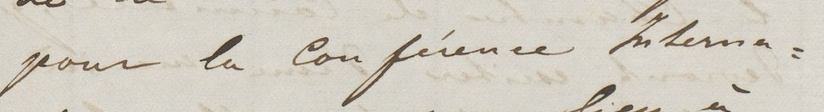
pour la Conférence Interna-
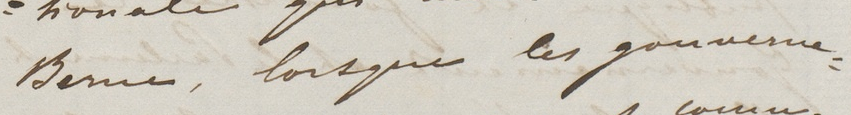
Berne, lorsque les gouverne-
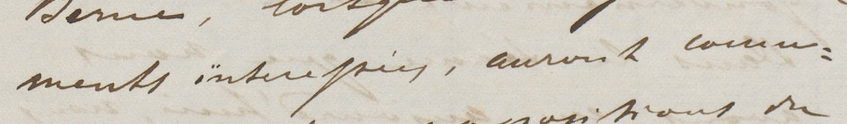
ments interessées, auront comu-
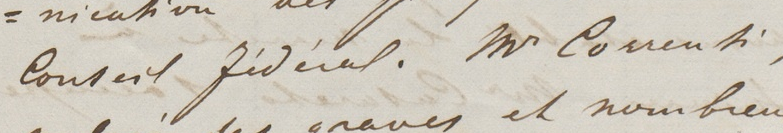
Conseil Fédéral. MrCorrenti,
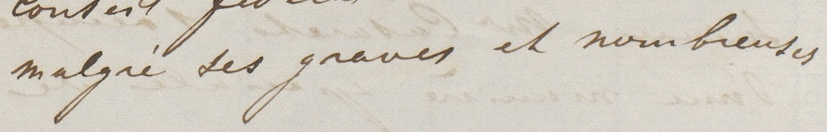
malgré ses graves et nombreuses
